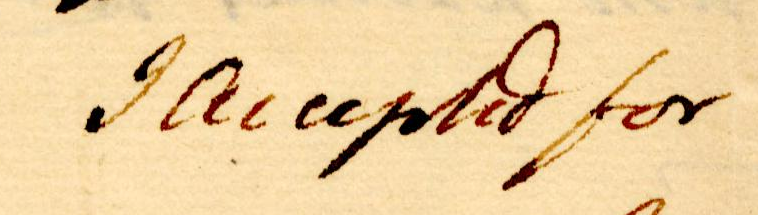I Accepted for
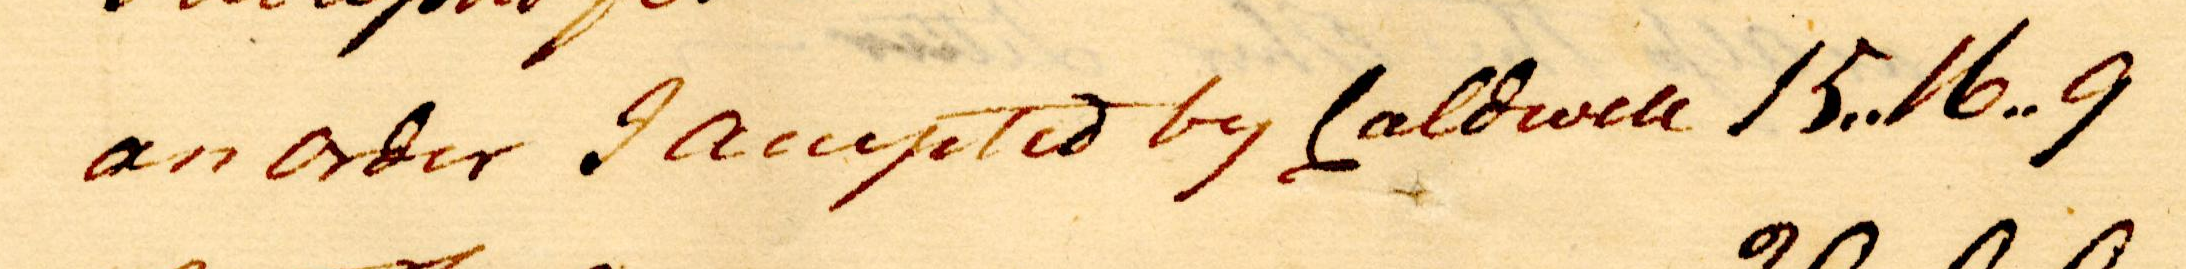an order I accepted by Caldwell 15..16..9
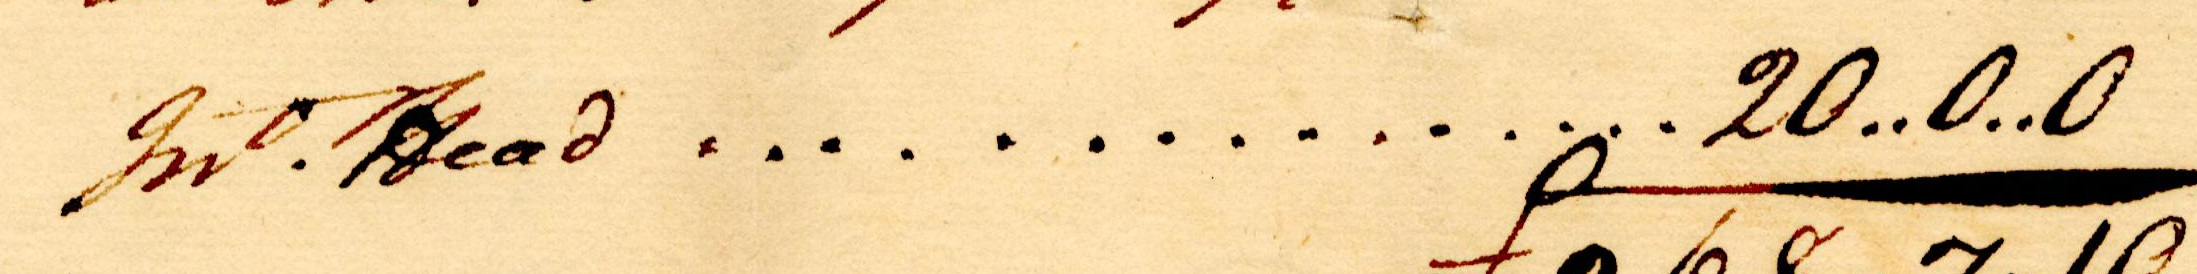In^d. Head ............ .. 20..0..0
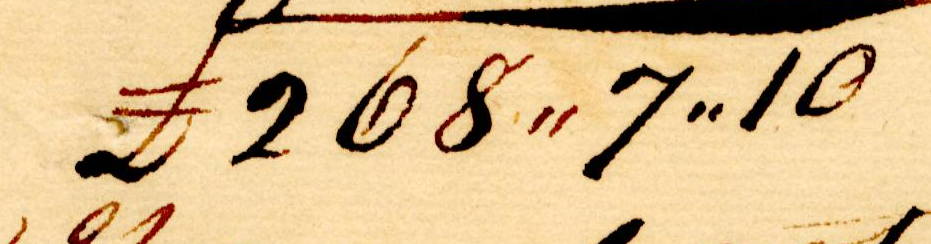£268..7..10
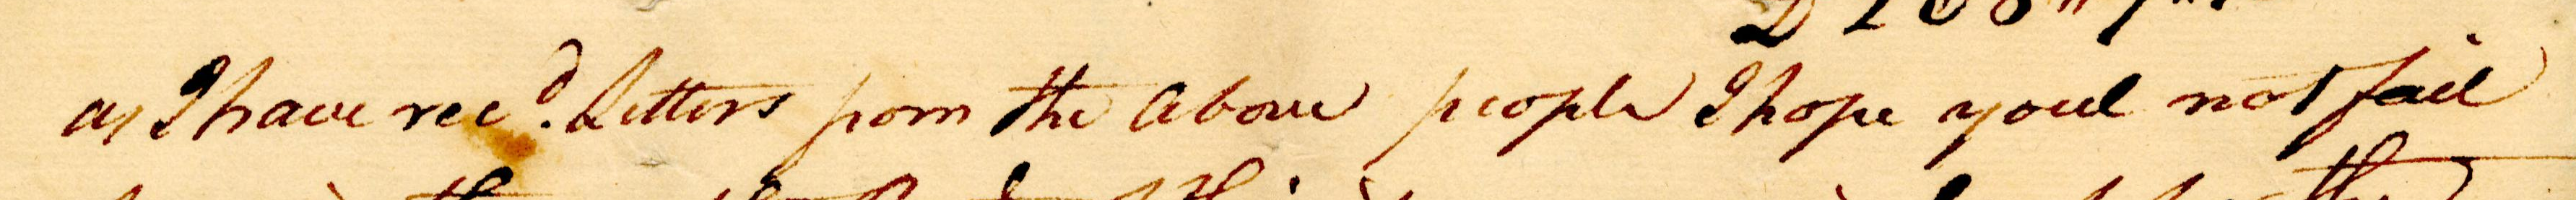as I have rec^d. Letters from the Above people I hope youl not fail
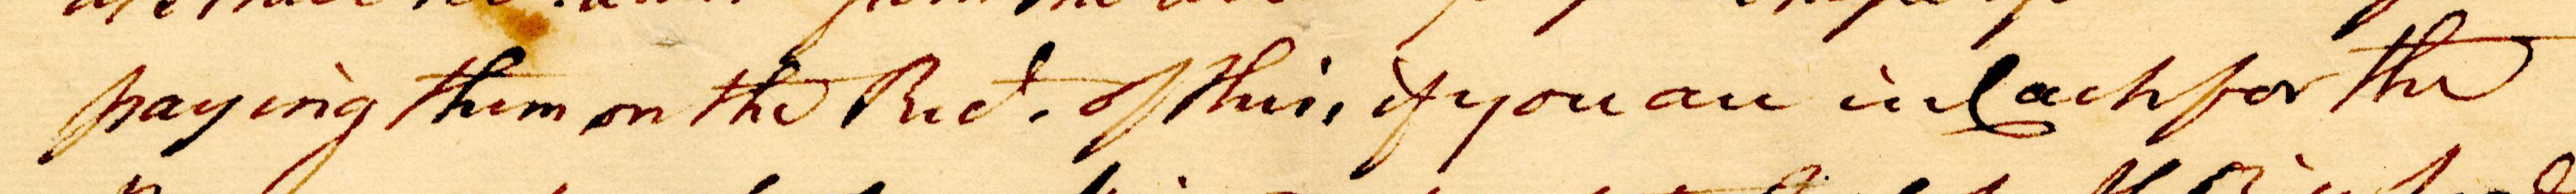paying them on the Rec^t. of this if you are in Cash for the
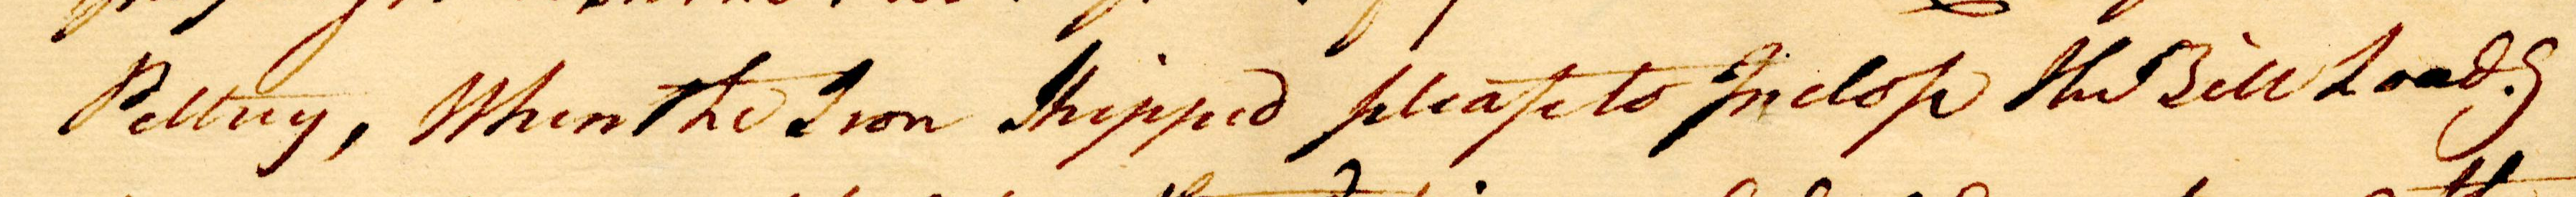Peltry, When the Iron Shipped please to Inclose the Bill Load.g
